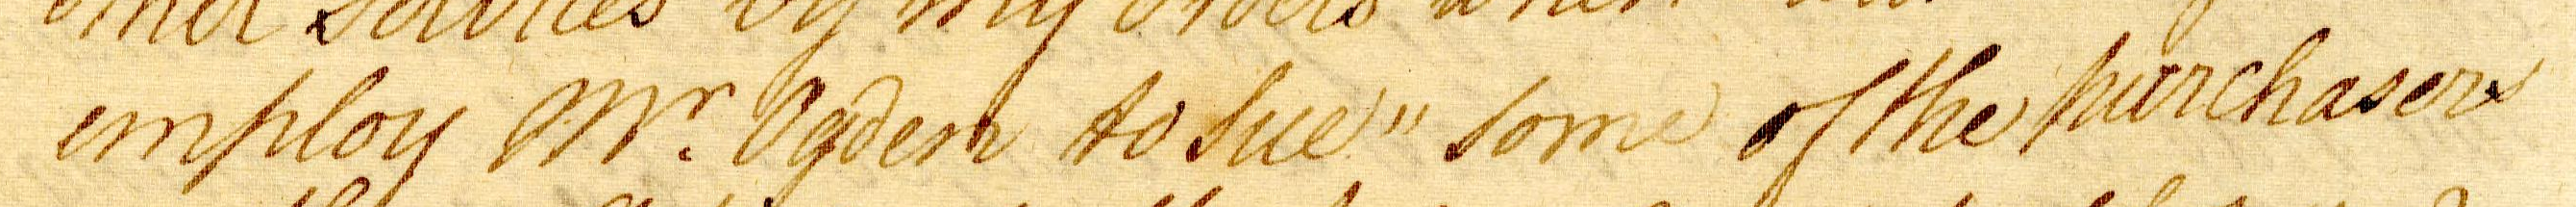imploy M^r. Ogden to sue" some of the purchasers
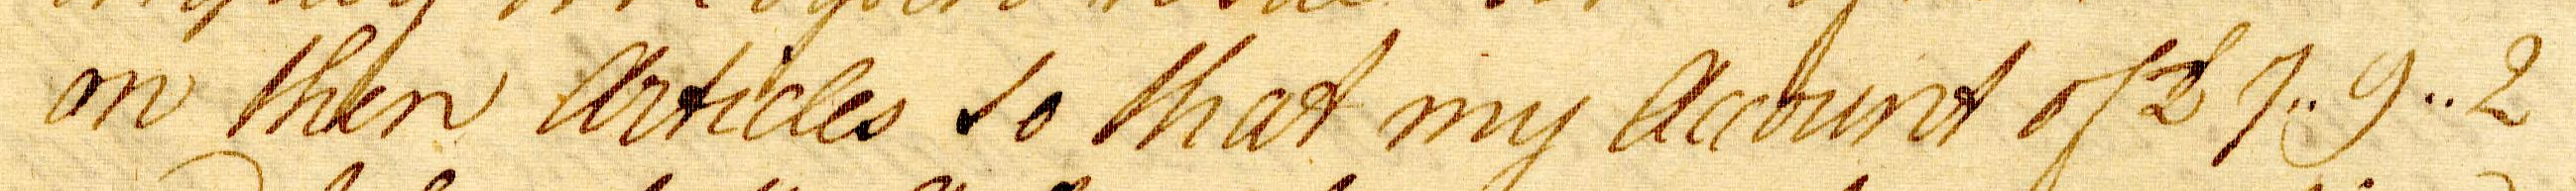on then Articles so that my Account of £7..9..2
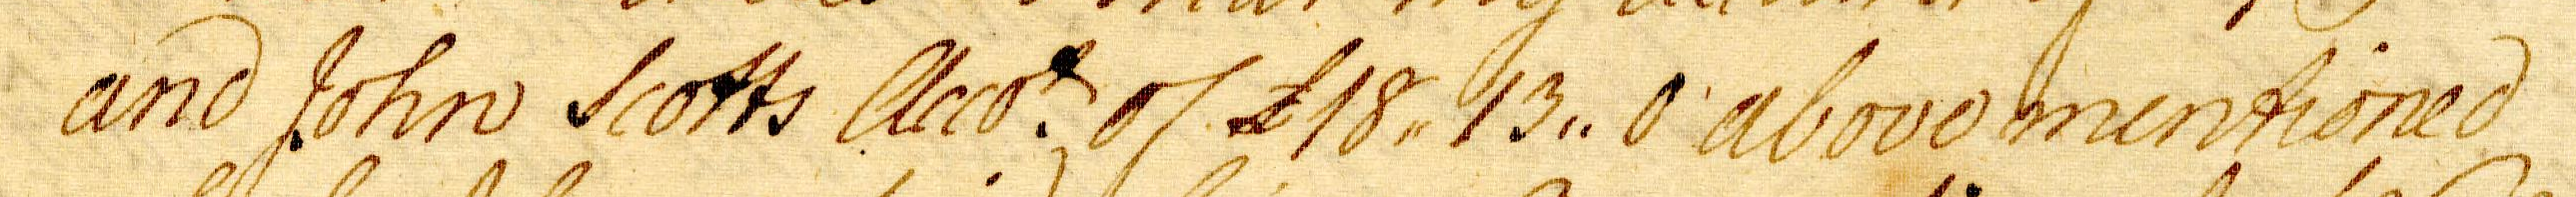and John Scotts Acco^t. of £18..13..0 above mentioned
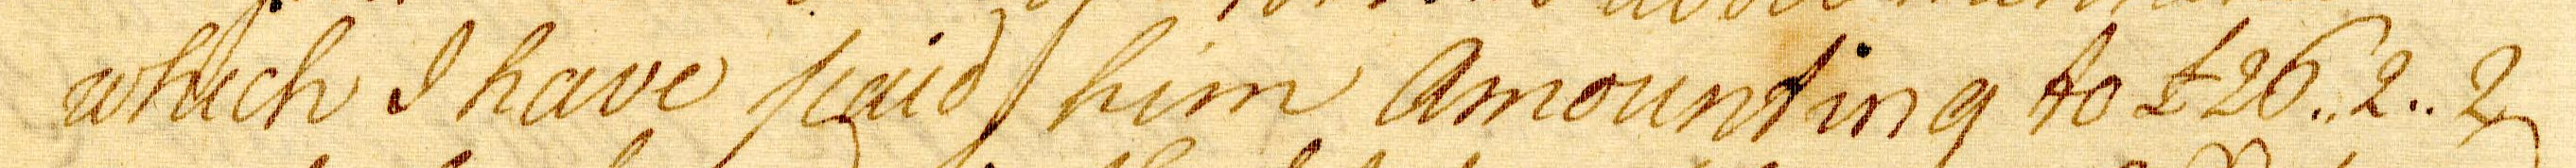which I have paid him Amounting to £26..2..2
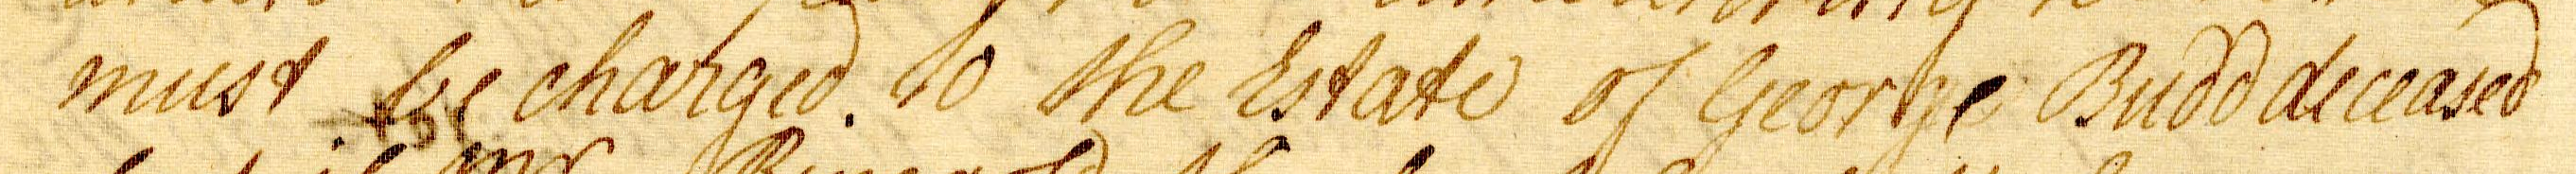must be charged to the Estate of George Budd deceased
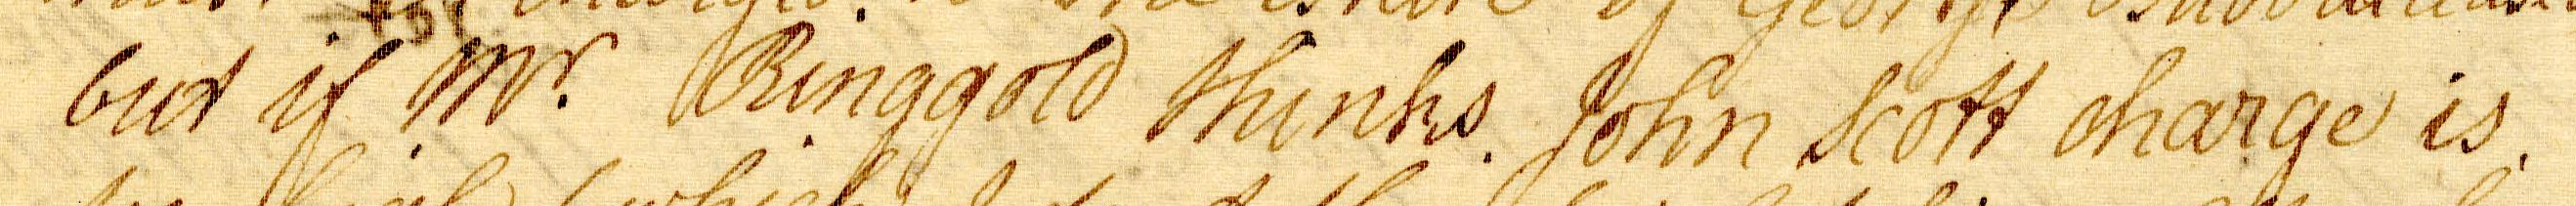but if M^r. Ringgold thinks John Scott charge is
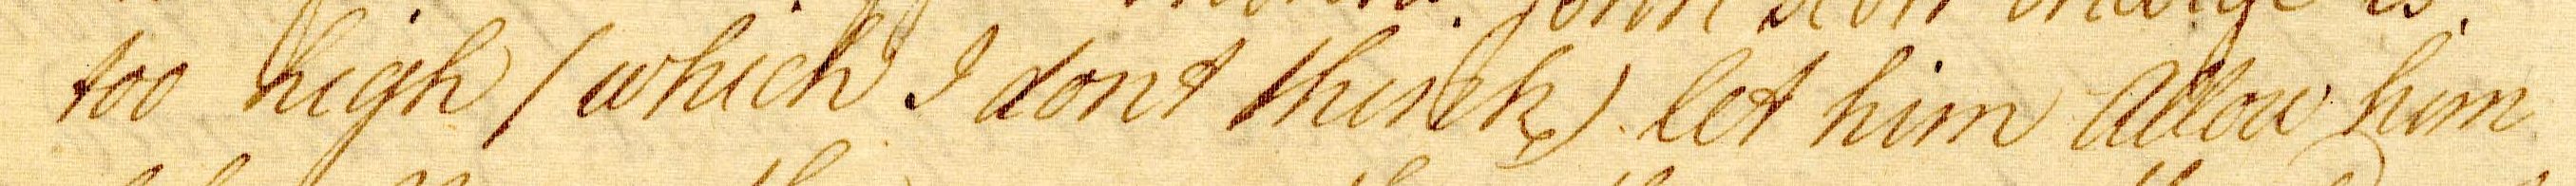to high (which I dont think) let him Allow him
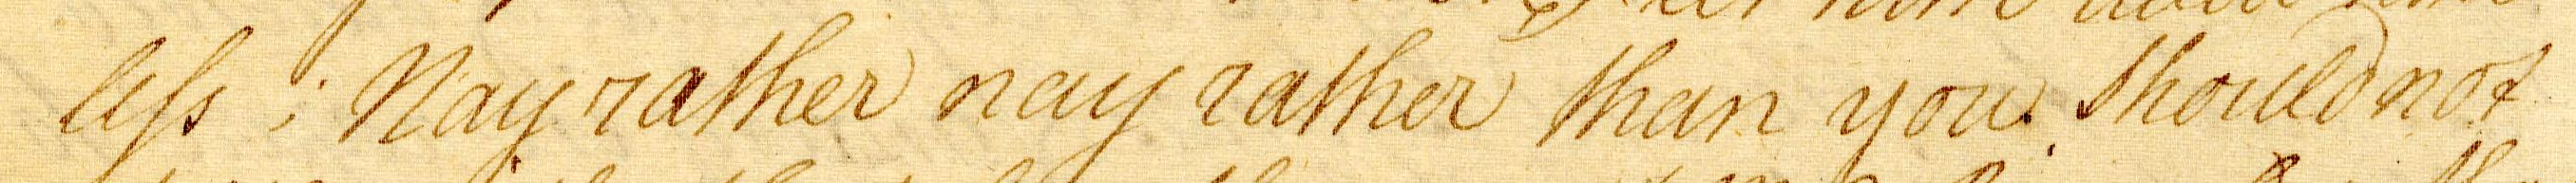less; Nay rather nay rather than you should not
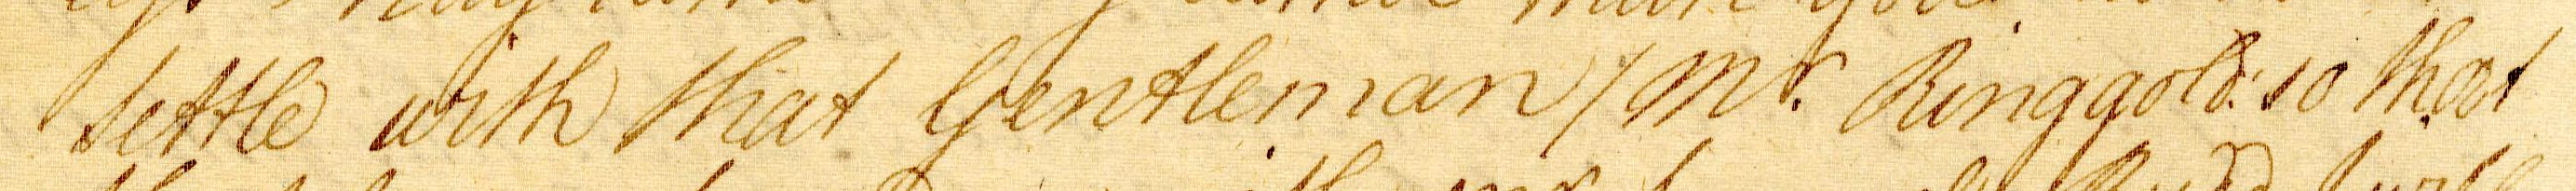settle with that Gentleman) M^r. Ringgold so that
